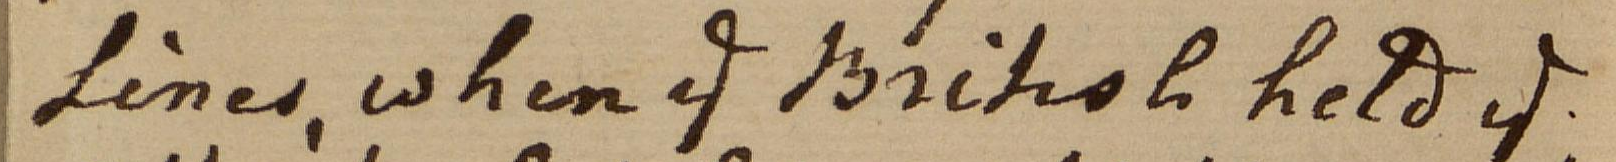Lines, when y^e British held y^e
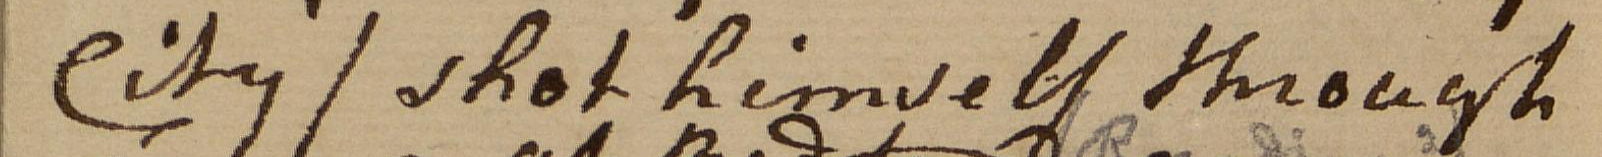City/ shot himself through
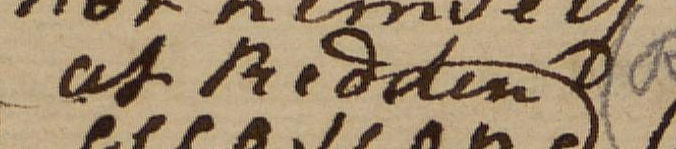as Ridden
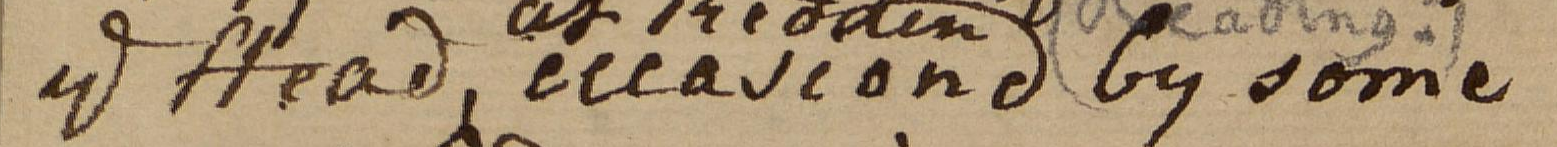y^e Head, occasiond by some
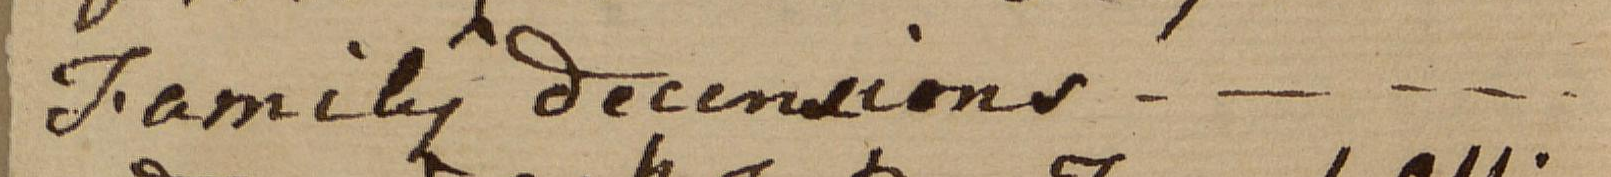Family decensions---
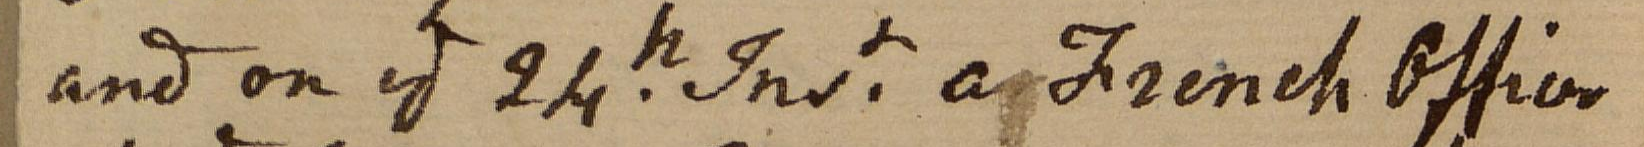and on y^e 24^h Ins^t. a French Officer
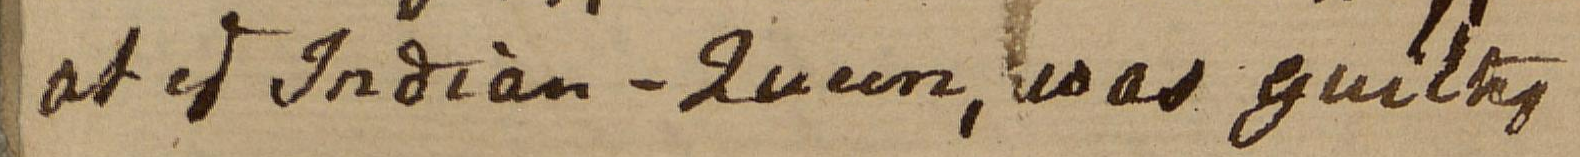at y^e Indian- Queen was guilty
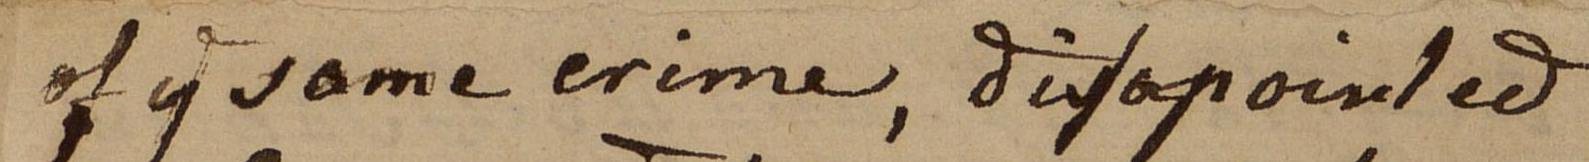of y^e same crime, dissapointed
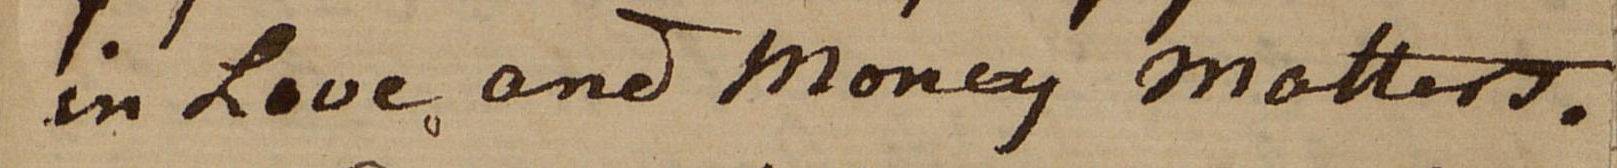in Love and Money Matters.
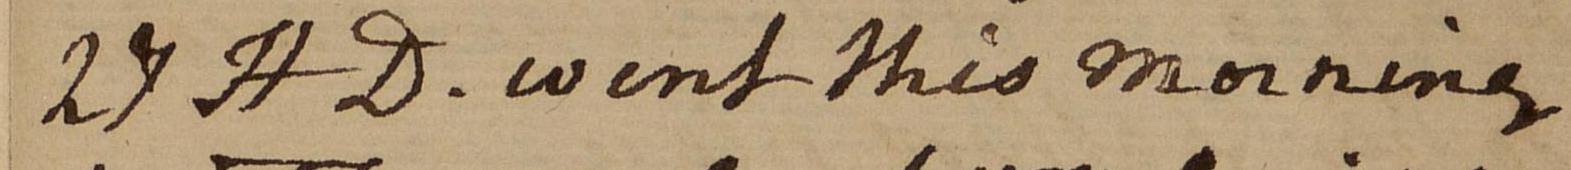27 HD. went this morning
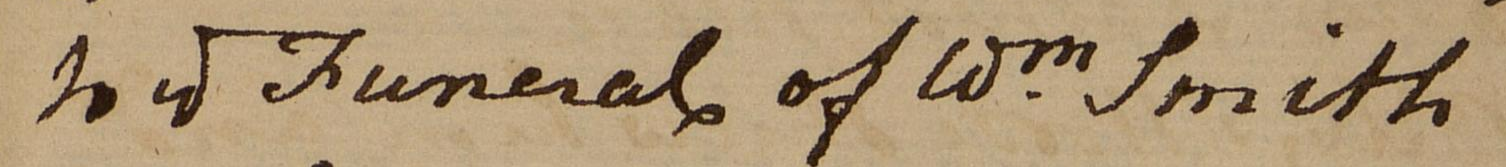to y^e Funeral of W^m. Smith
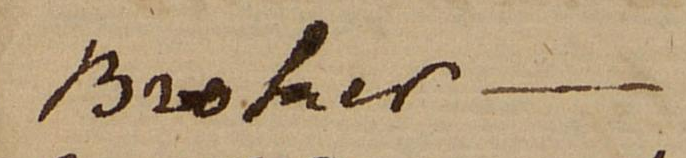Broker-
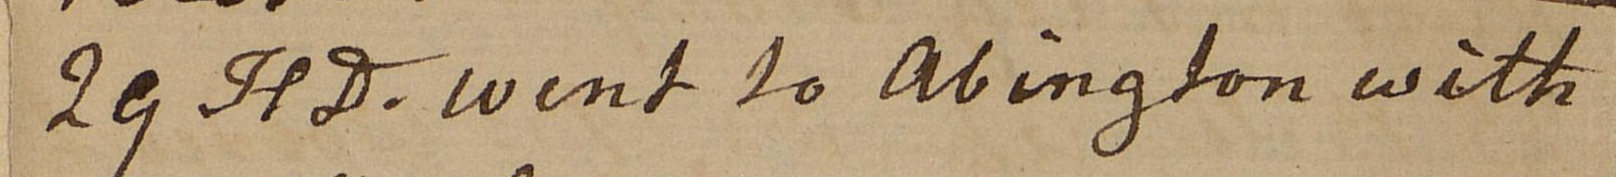29 HD. went to Abington with
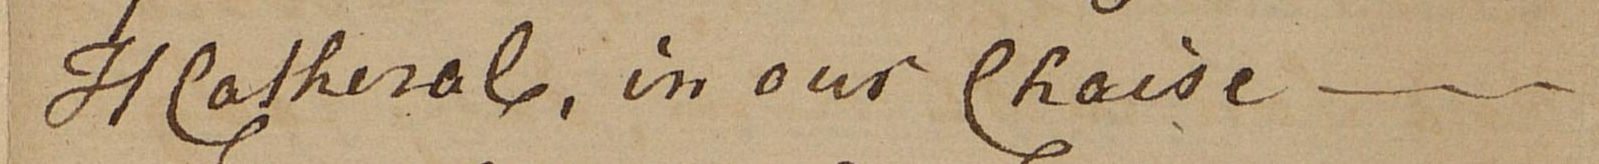H Catheral, in our Chaise-
